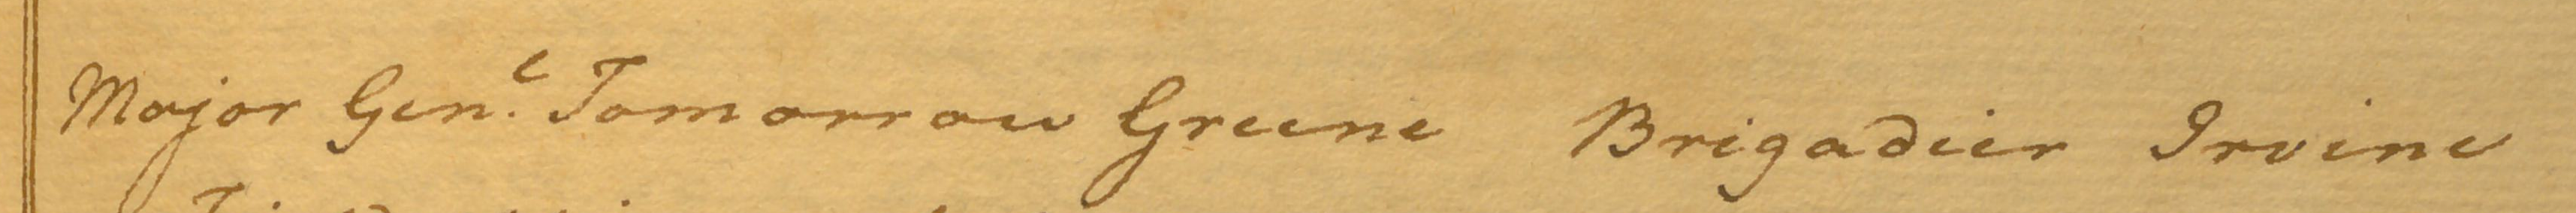Major Gen^l. Tomorrow Greene Brigadier Irvine
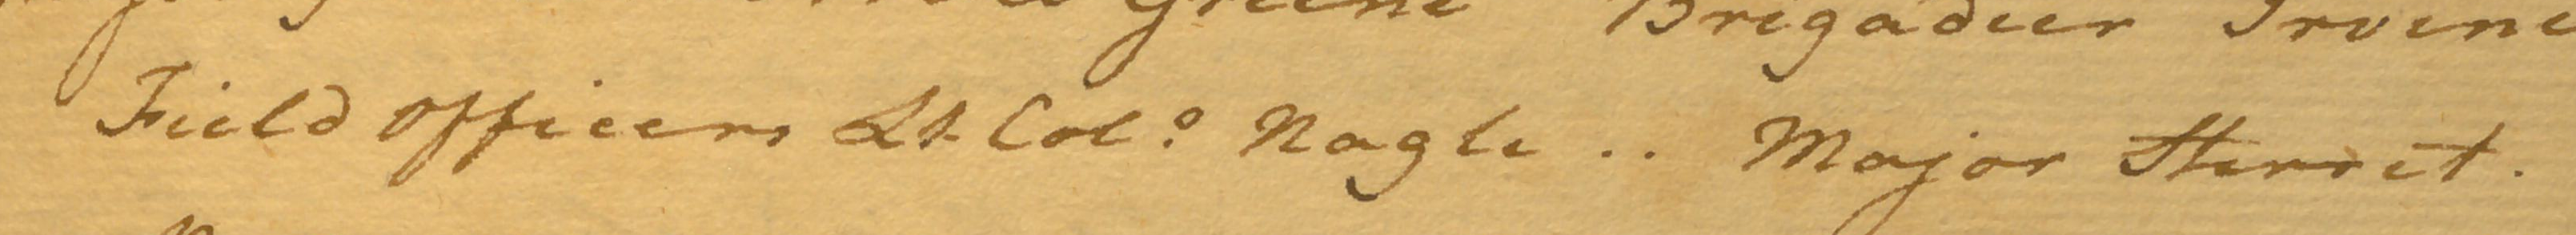Field Officers Lt Col^o. Nagle. . Major Sterret.
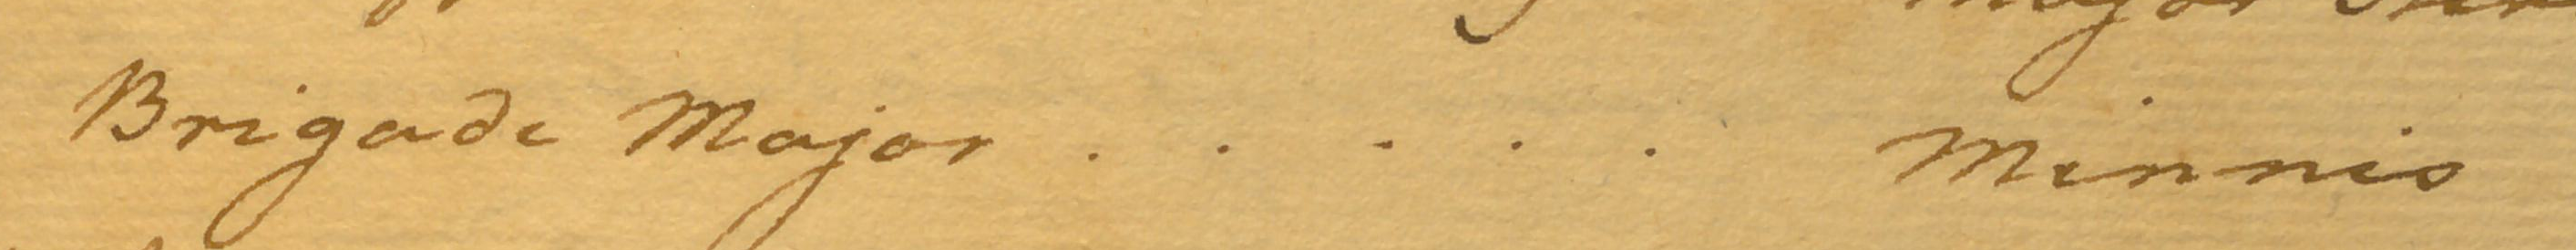Brigade Major. .... Minnis
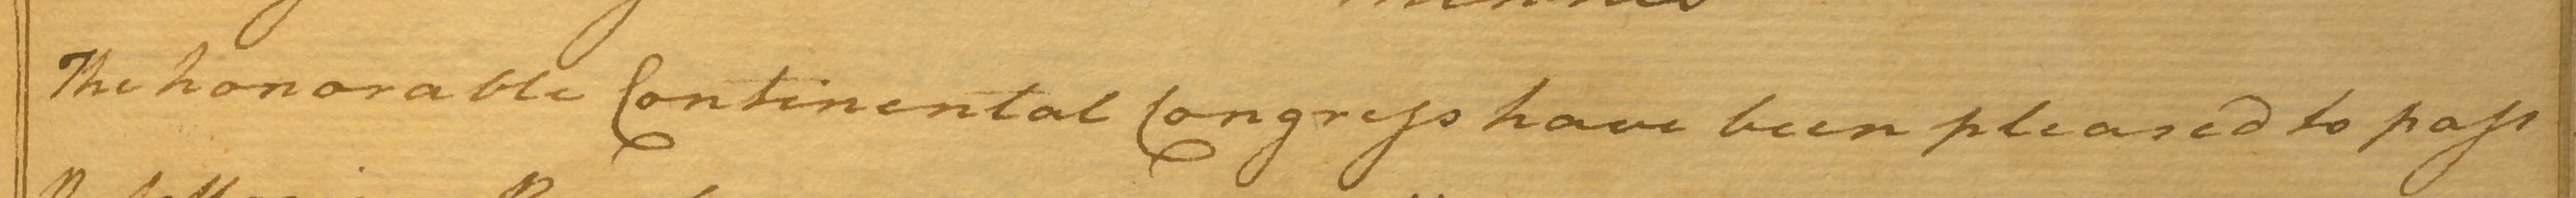The honourable Continental Congress have been pleased to pass
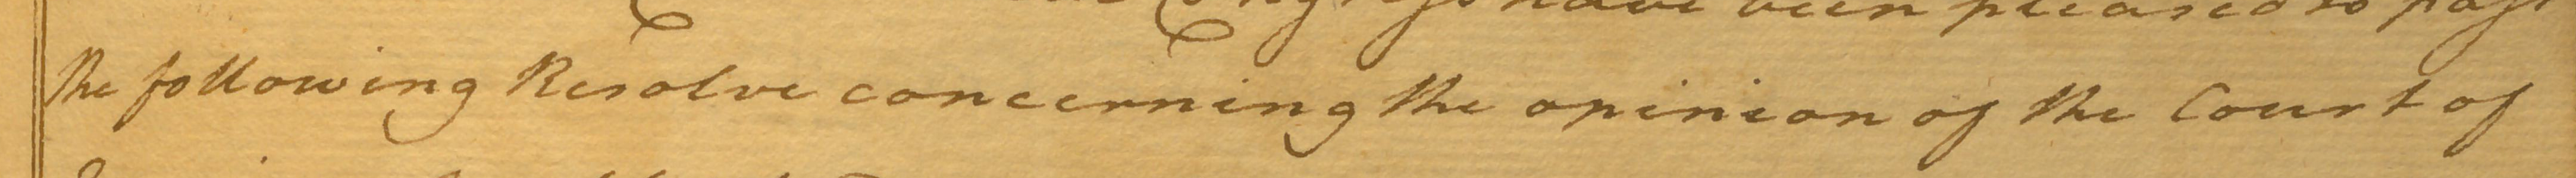the following Resolve concerning the opinion of the Court of
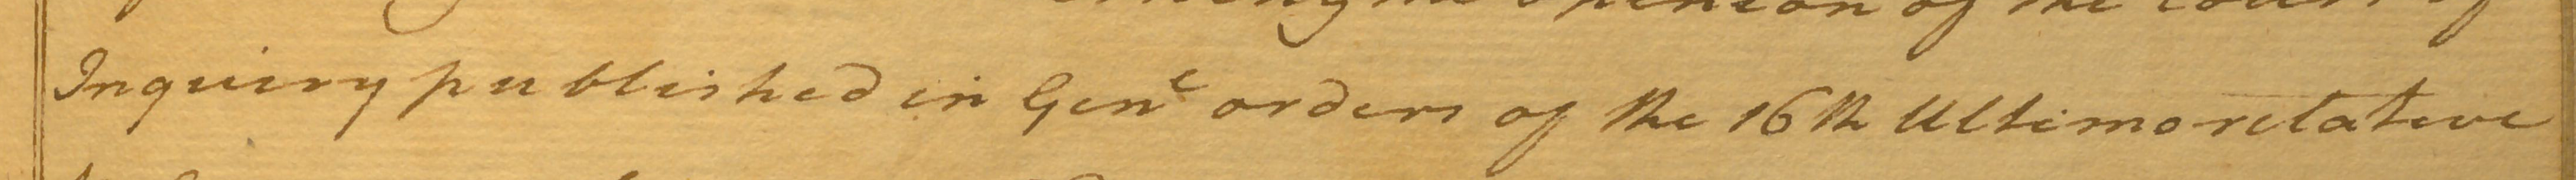Inquiry published in Gen^l orders of the 16th Ultimo relative
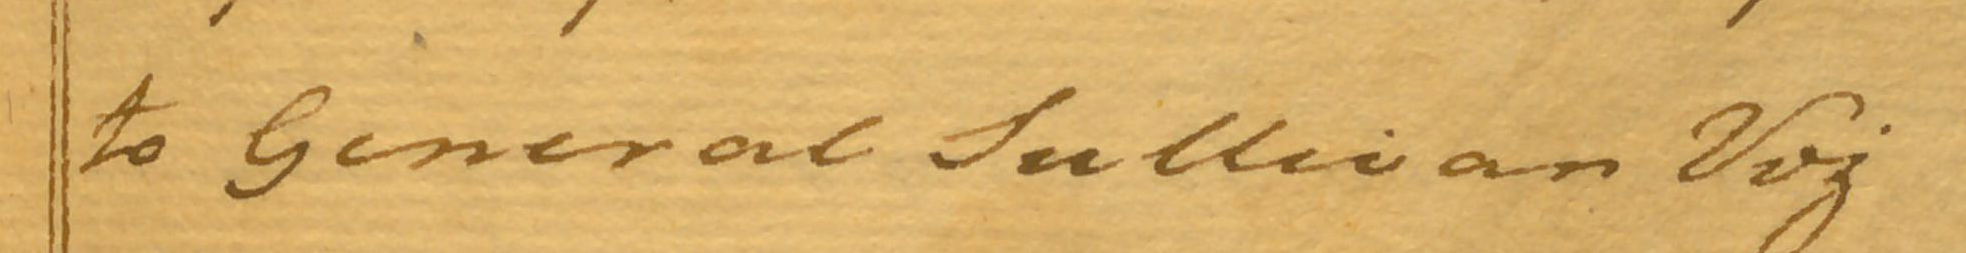to General Sullivan Viz
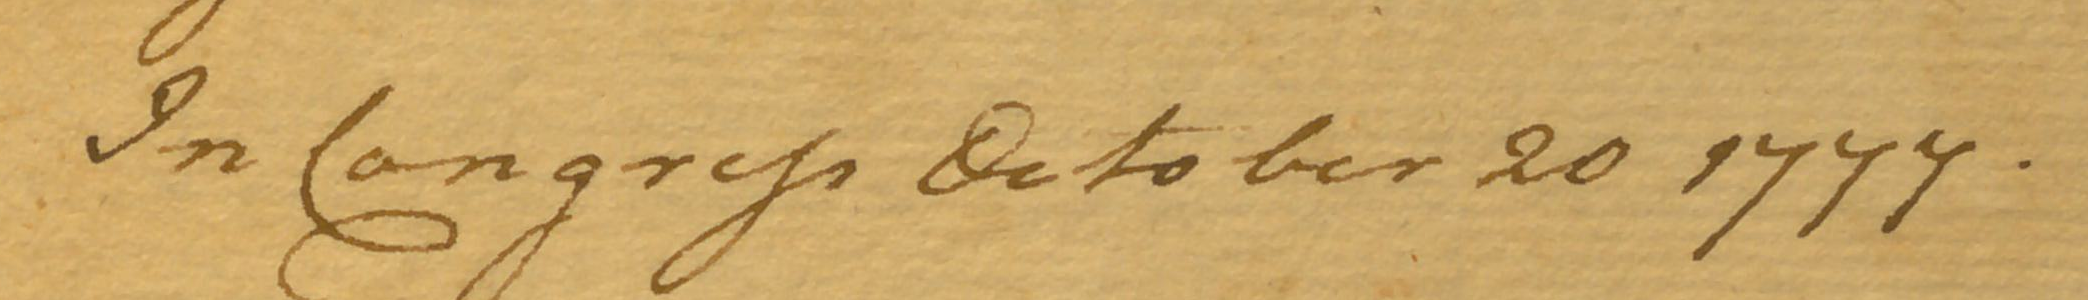In Congress October 20 1777.
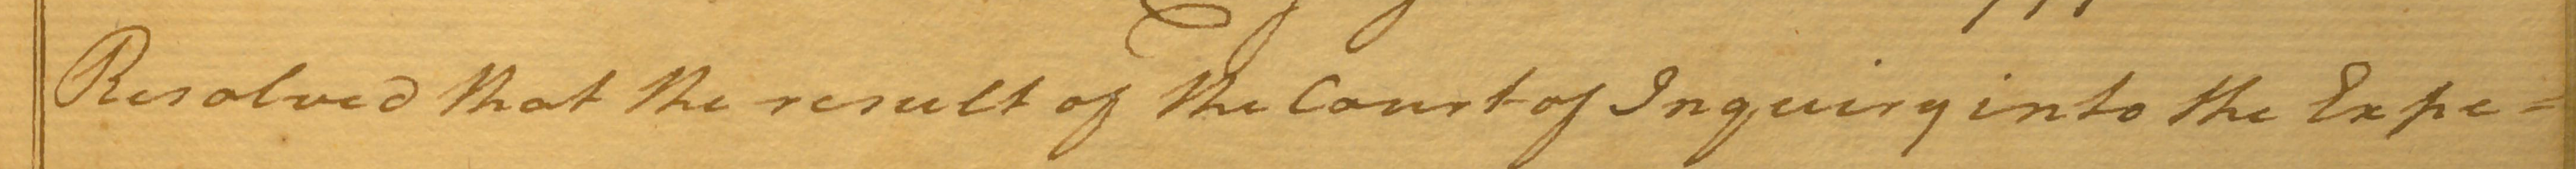Resolved that the result of the Court of Inquiry into the Expe-
